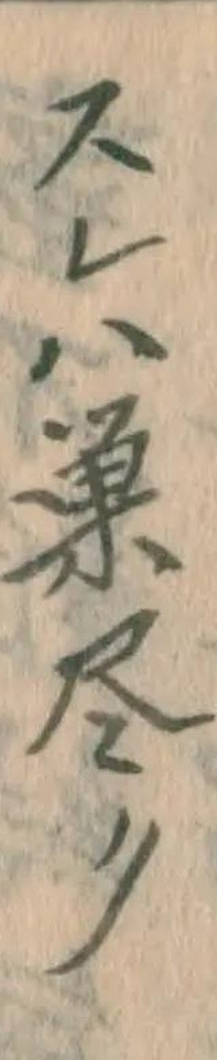スレハ巣尽ク
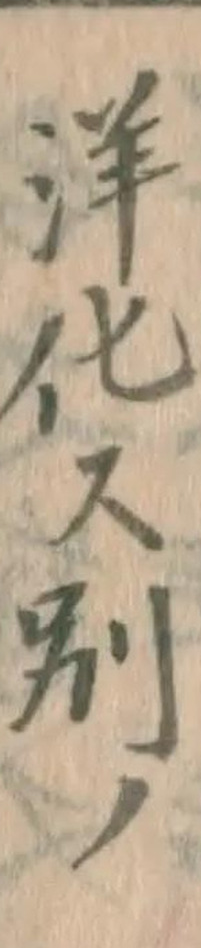洋化ス別ノ
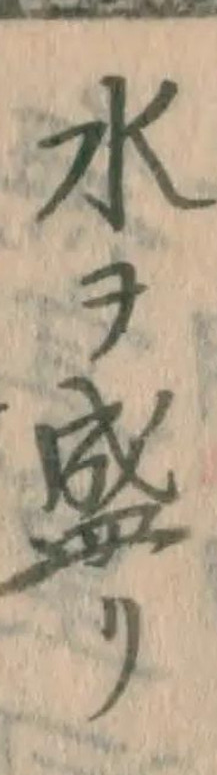水ヲ盛リ
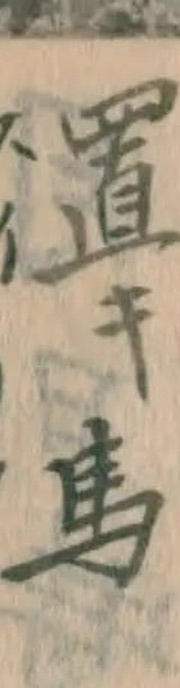置キ馬
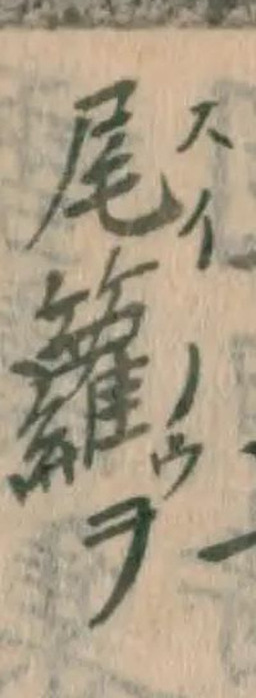尾籮ヲ
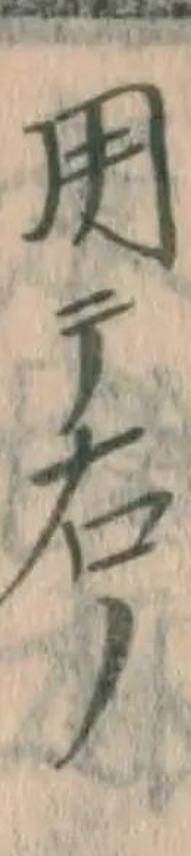用テ右ノ
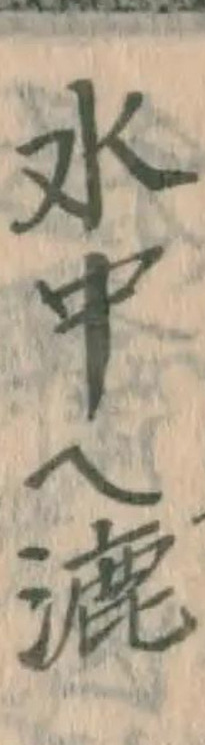水中ヘ漉
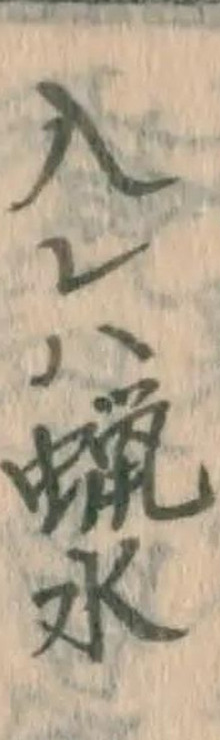入レハ蠟水
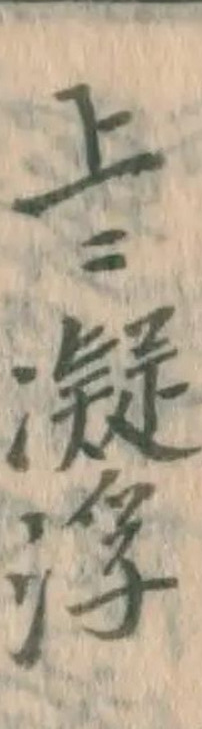上ニ凝浮
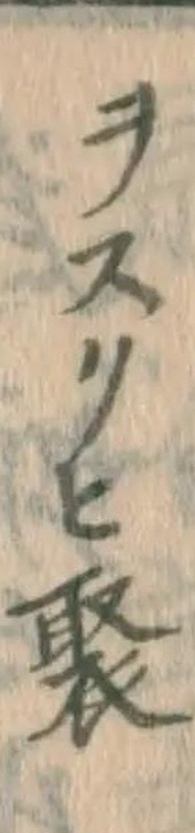ヲスクヒ聚
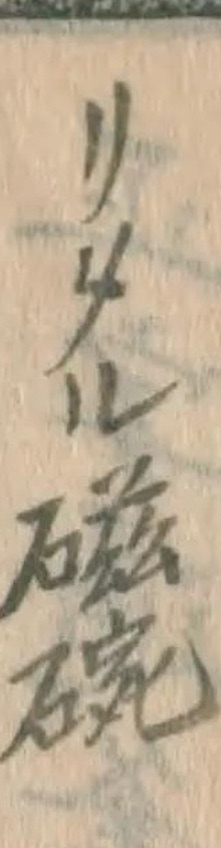リタル磁碗
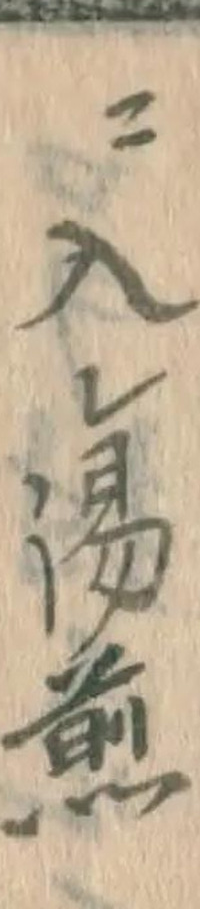ニ入レ湯煎
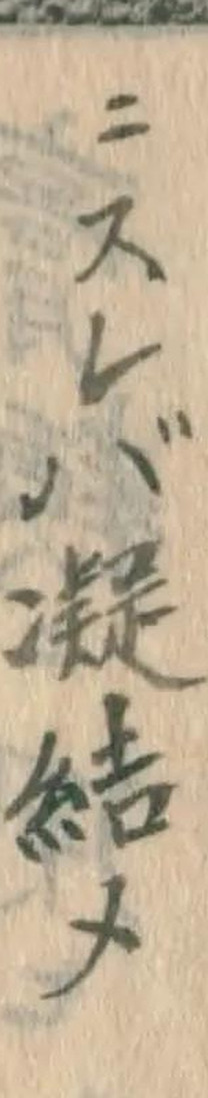ニスレバ凝結シテ
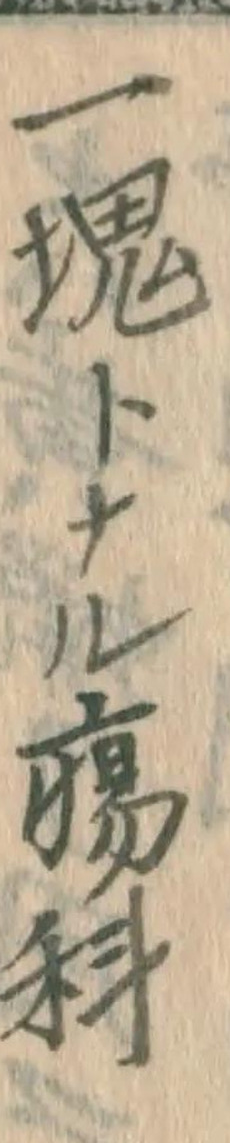一塊トナル瘍科
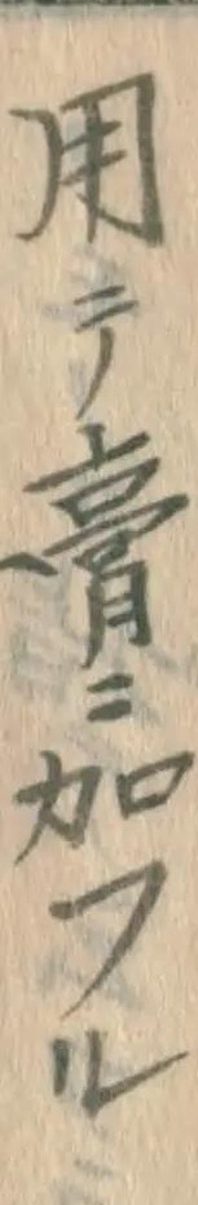用テ膏ニ加フル
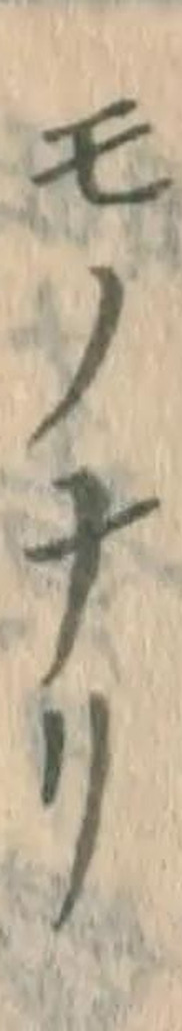モノナリ
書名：千蟲譜 3巻. [1]
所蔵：国立国会図書館 National Diet Library, JAPAN
